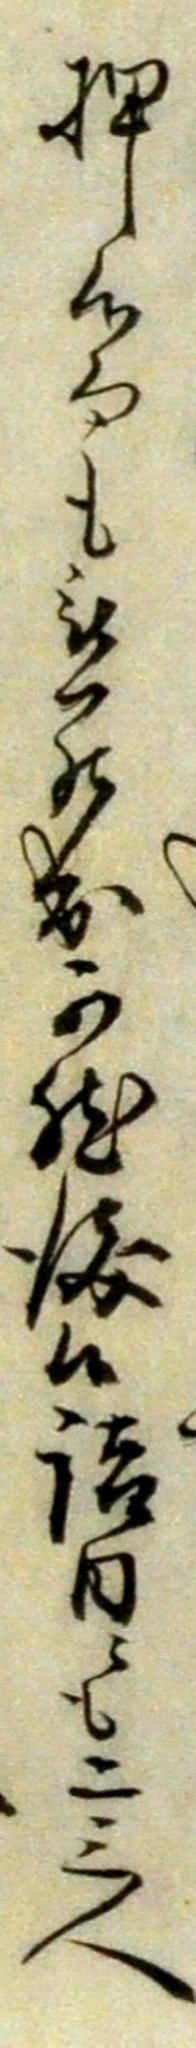押候ても被罷出可然儀候詰日にも二三人
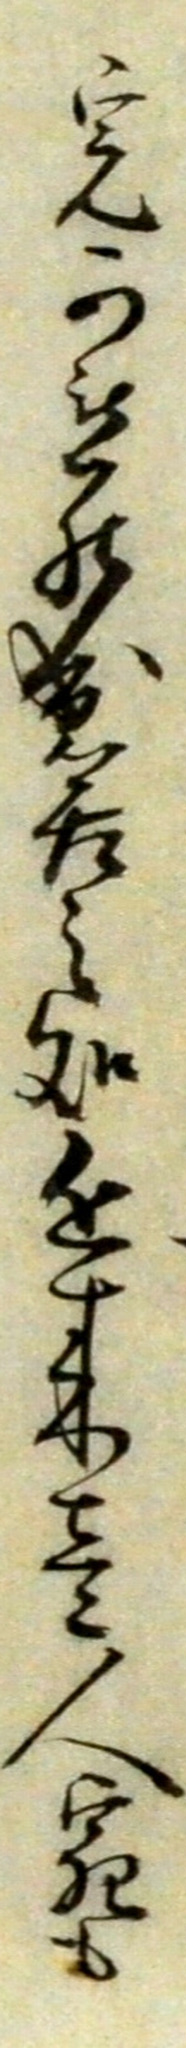完可被罷出筈之処近来壱人宛も
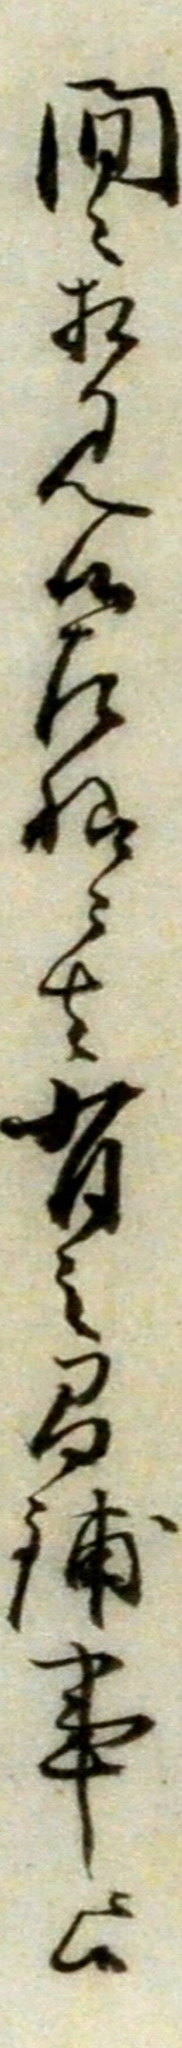間々相見候左様には有之間鋪事に候
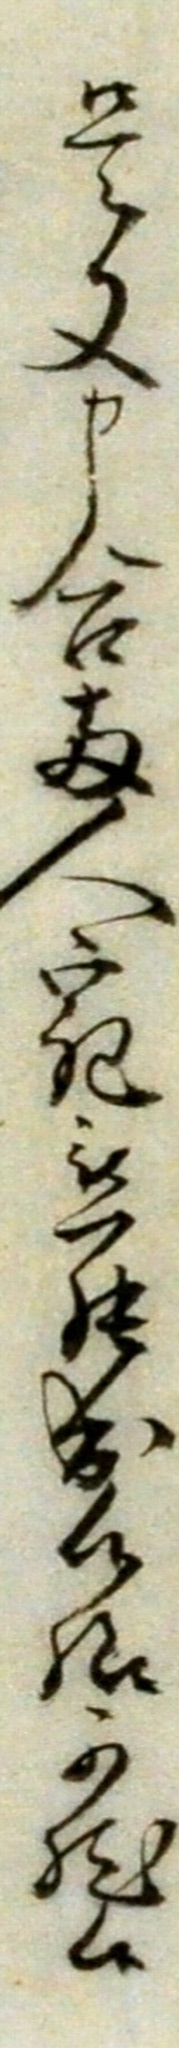是又申合両人宛被罷出候様可然候
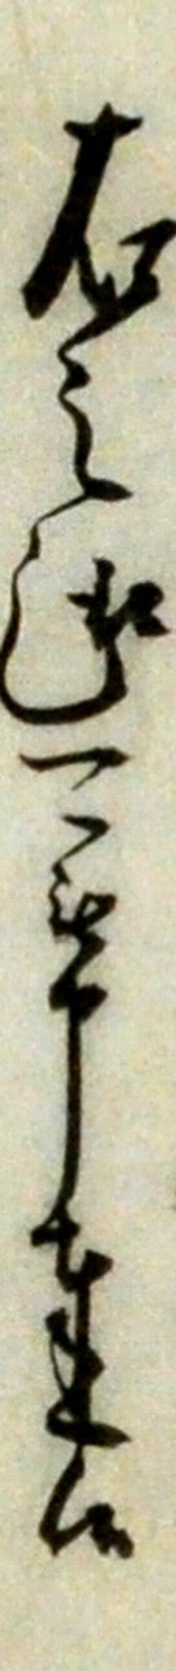右之趣可被申達候
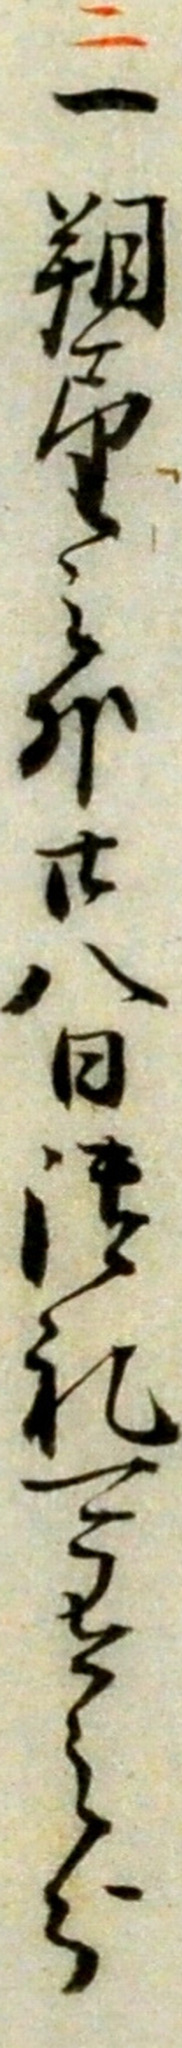一朔望之外廿八日御礼可有之分
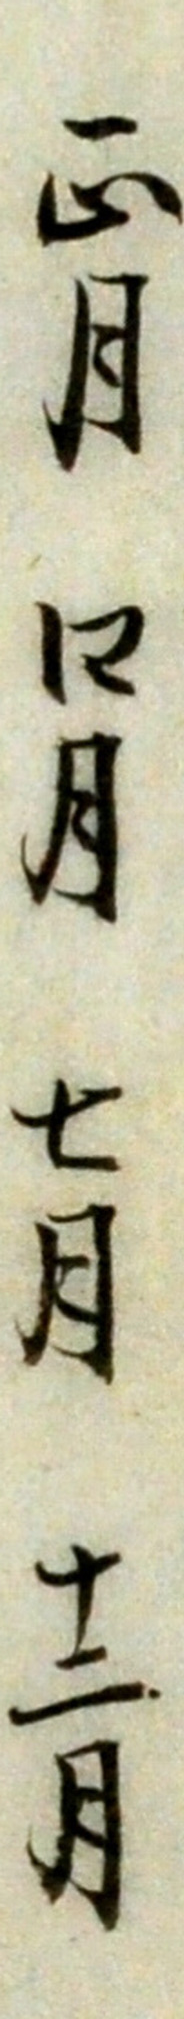正月四月七月十二月
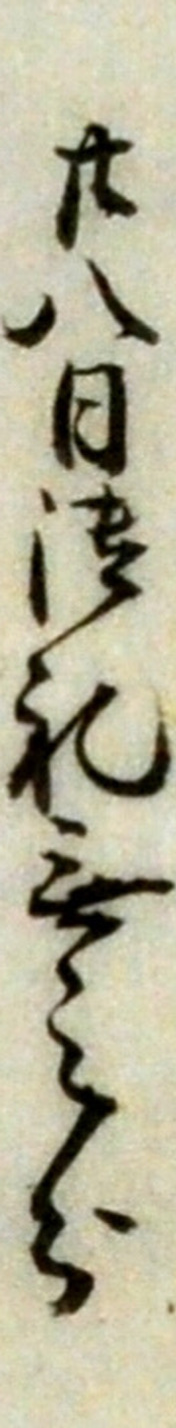廿八日御礼無之分
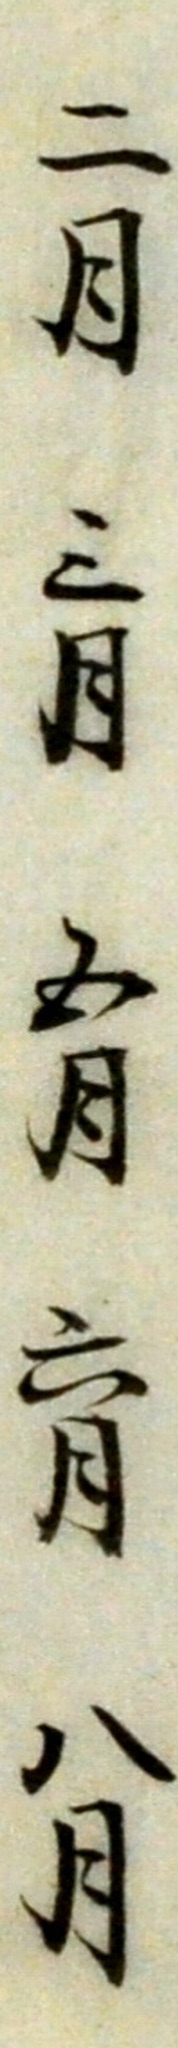二月三月五月六月八月
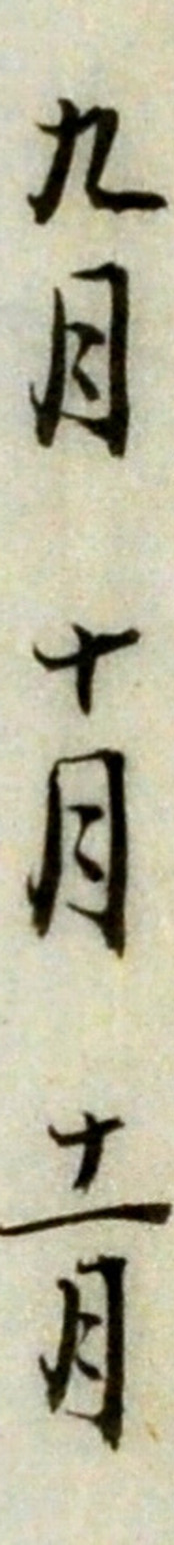九月十月十一月
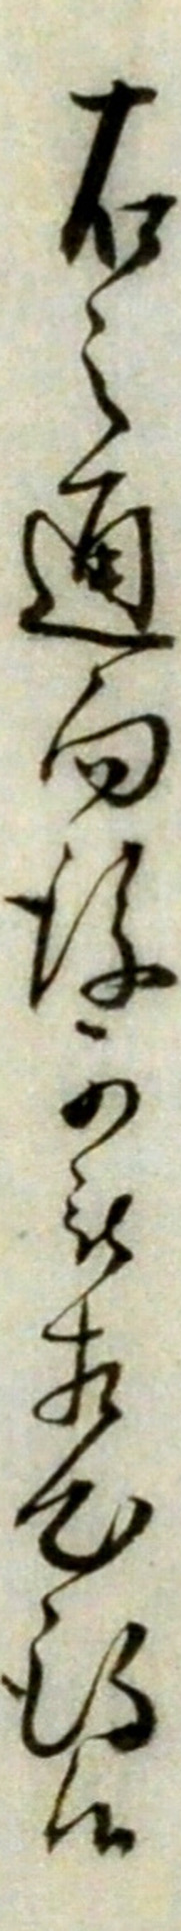右之通向後可被相心得候

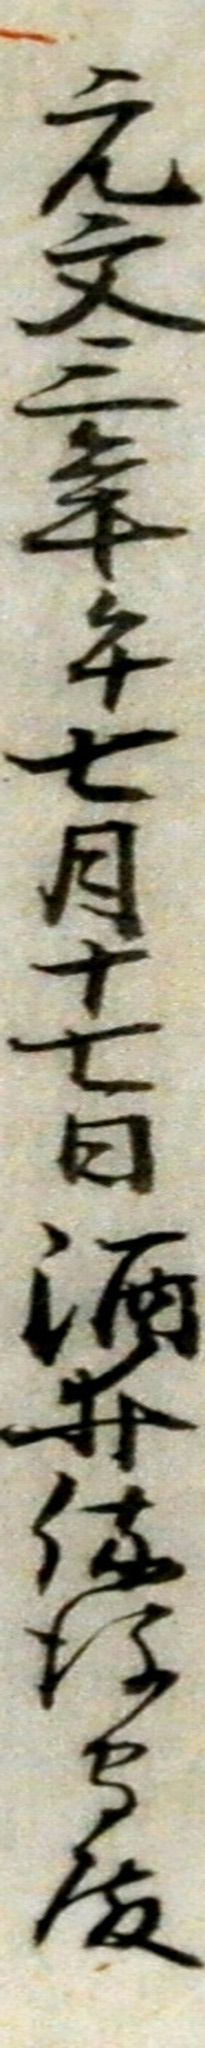元文三年午七月十七日酒井備後守殿
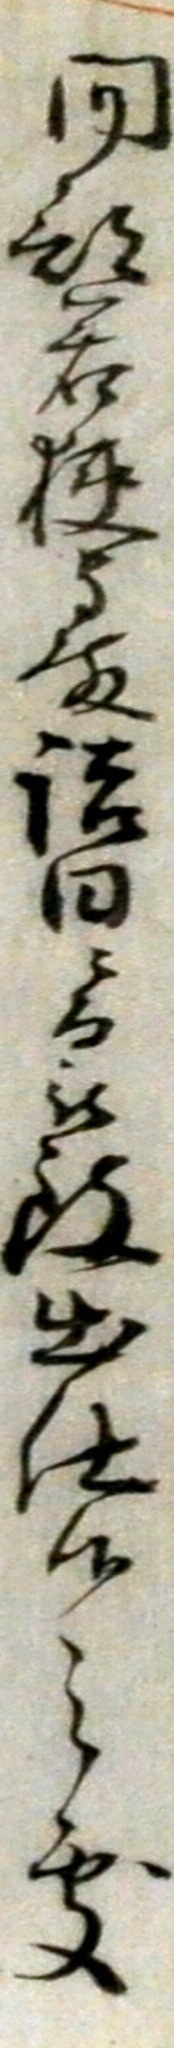間部若狭守殿詰日にて被致出仕候之処
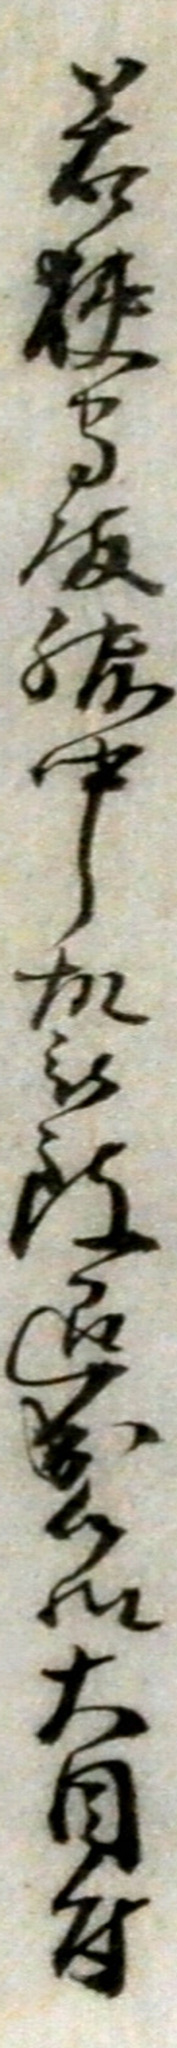若狭守殿服中故被致退出候様大目付
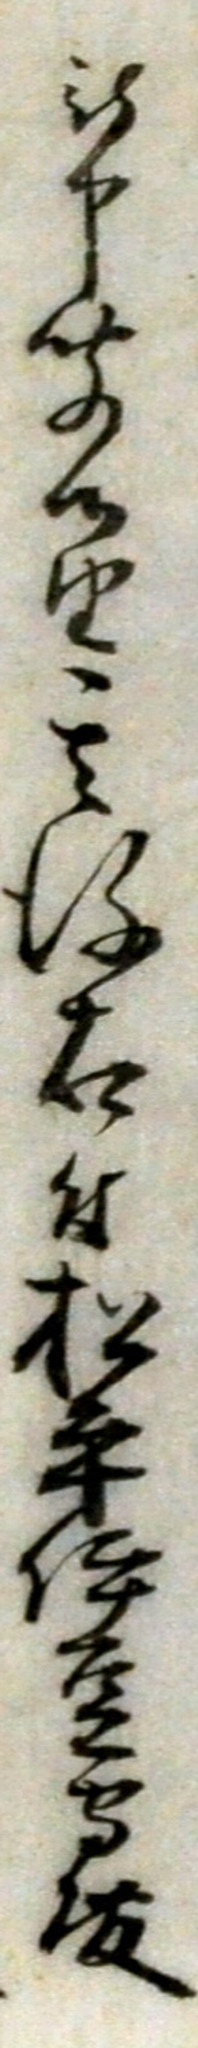被申聞候由其後右付松平伊豆守殿
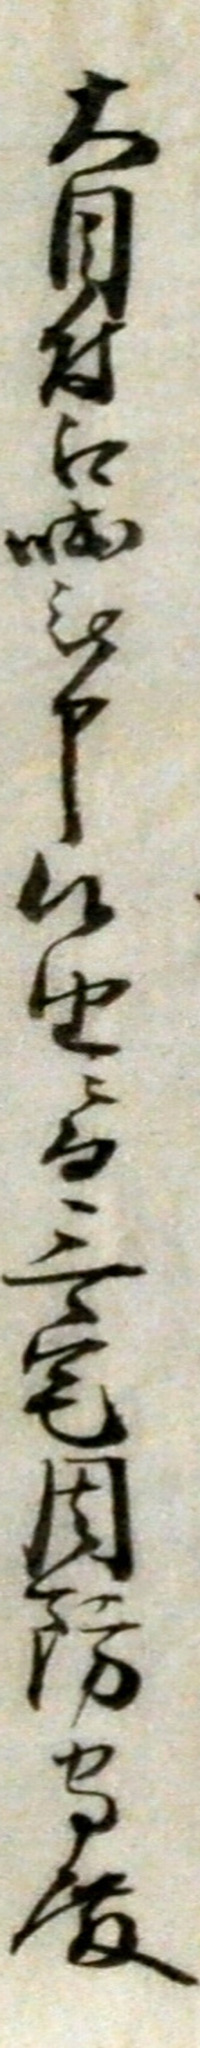大目付え咄被申候由にて三宅周防守殿
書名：申合帳〔一括〕
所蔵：伊那市立高遠町図書館・合同会社AMANE
